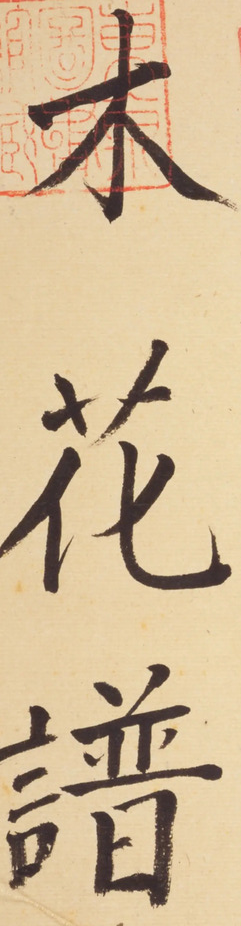木花譜
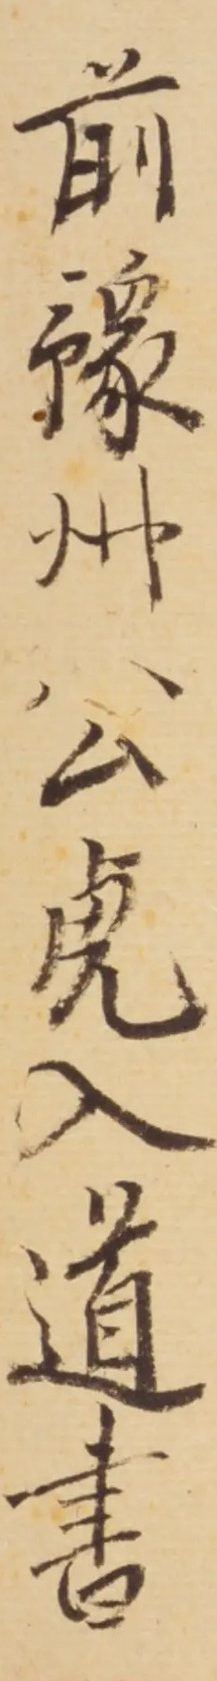前予州公虎入道書

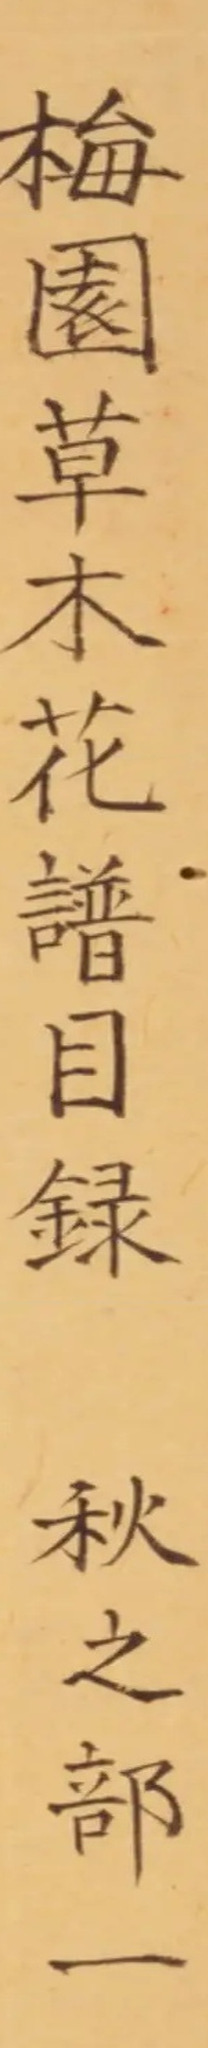梅園草木花譜目録秋之部一
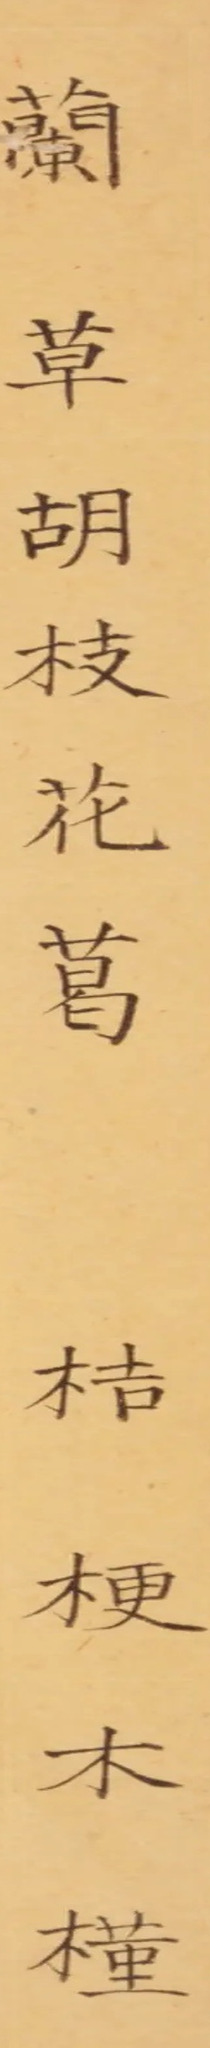蘭草胡枝花葛桔梗木槿
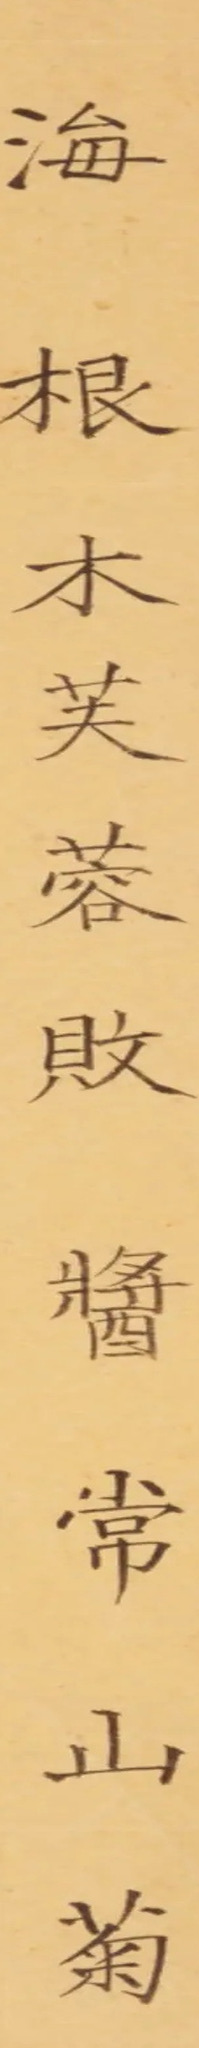海根木芙蓉敗醤常山菊
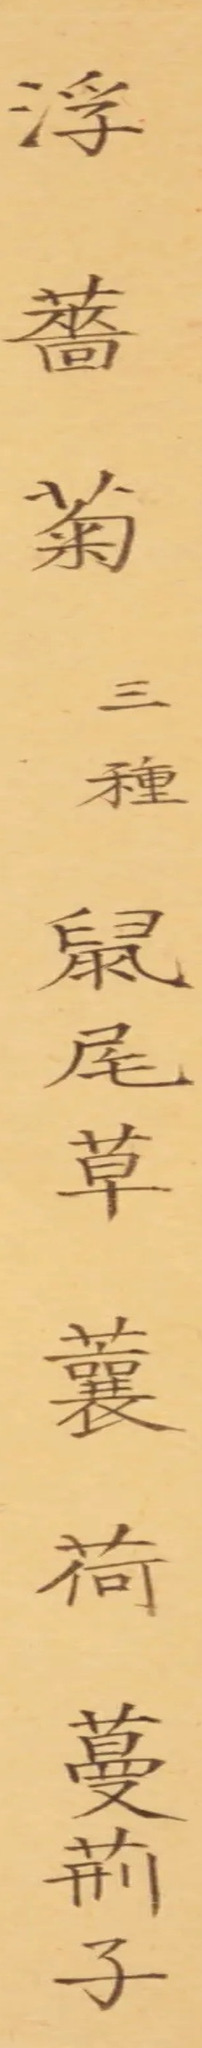浮薔菊三種鼠尾草蘘荷蔓荊子
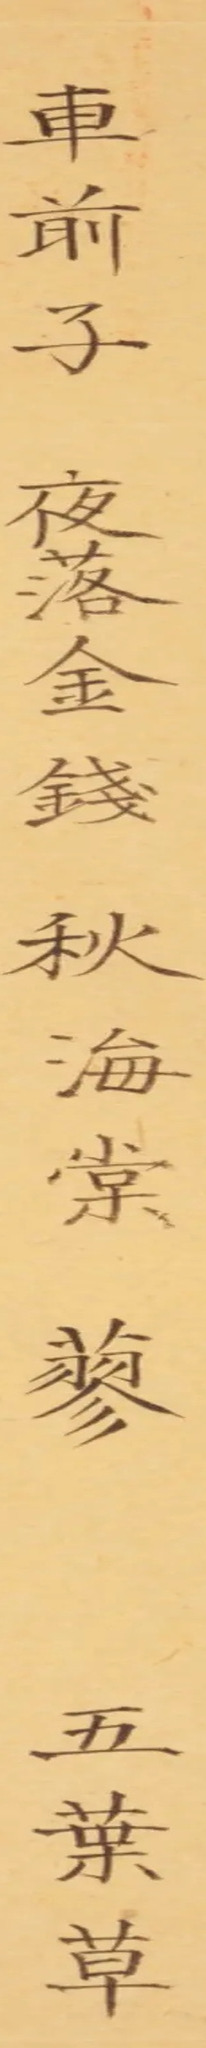車前子夜落金銭秋海棠蓼五葉草
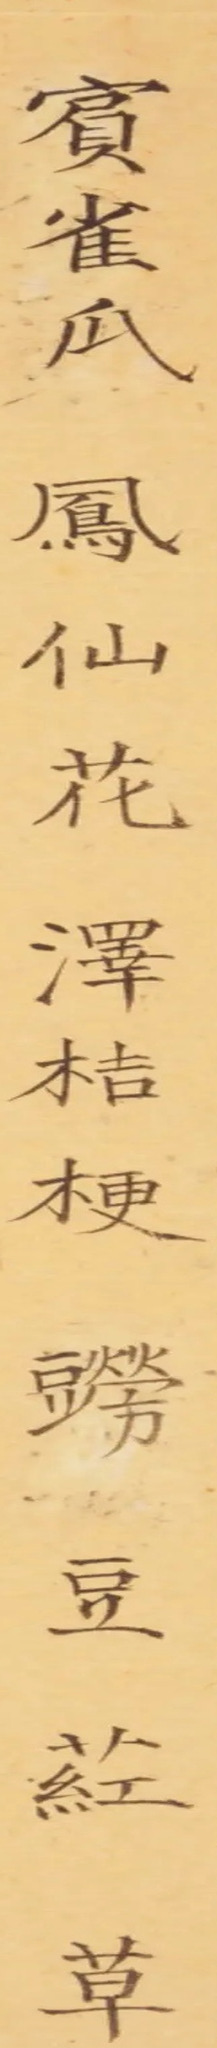賓雀瓜鳳仙花沢桔梗豆葒草
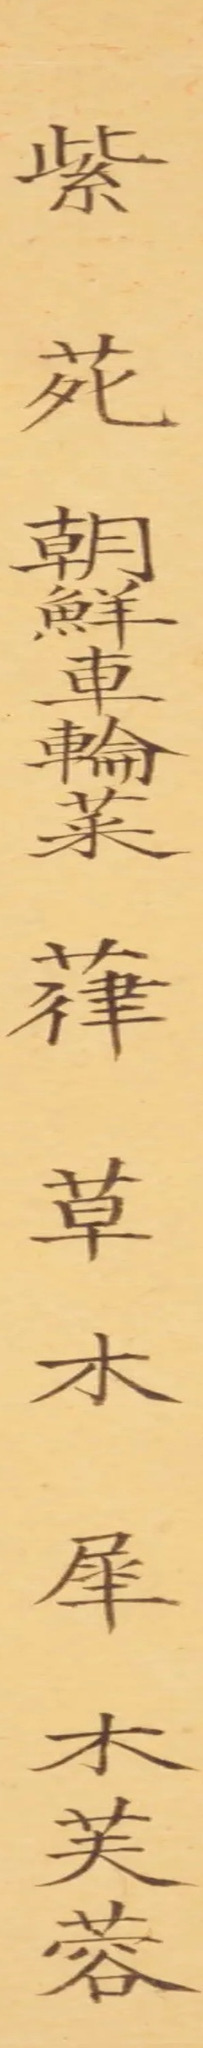紫苑朝鮮車輪菜葎草木犀木芙蓉
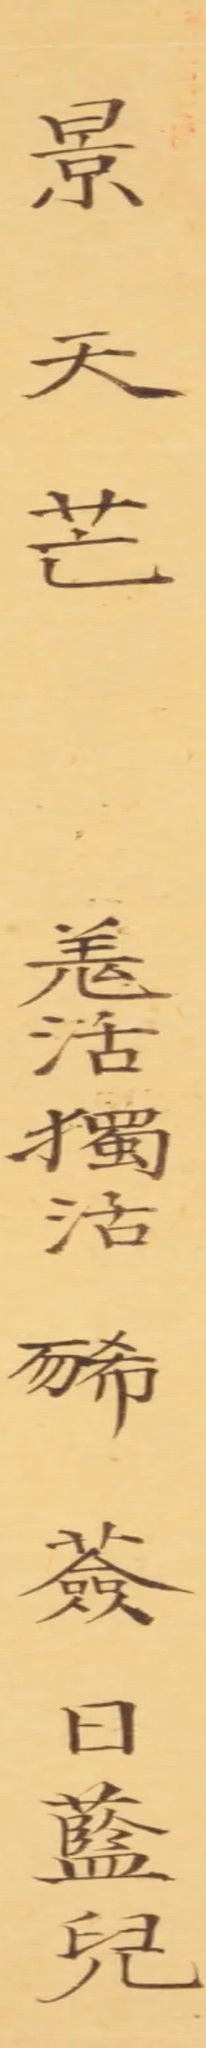景天芒羗活独活豨薟日藍児
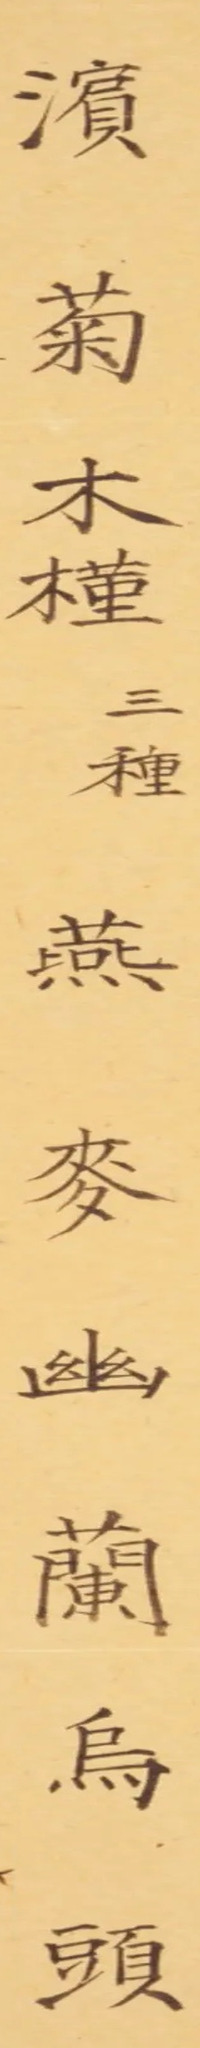浜菊木槿三種燕麦幽蘭烏頭
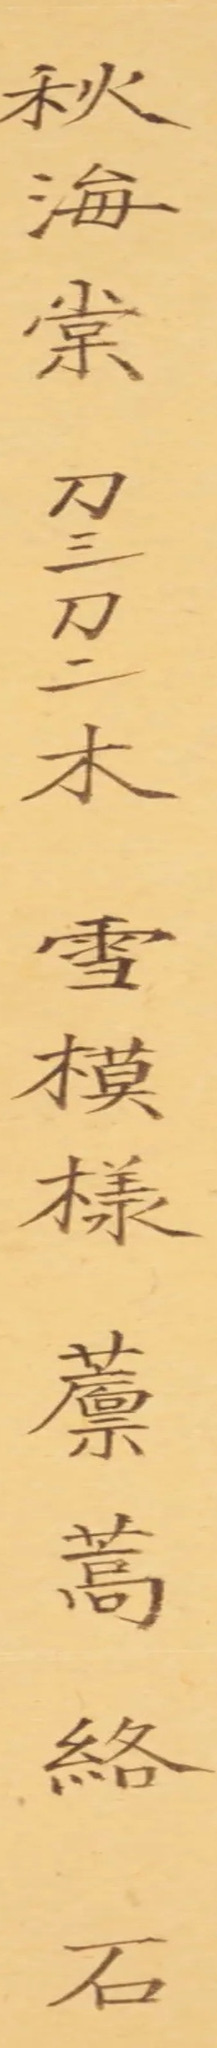秋海棠カシカン木雪模様䕲蒿絡石
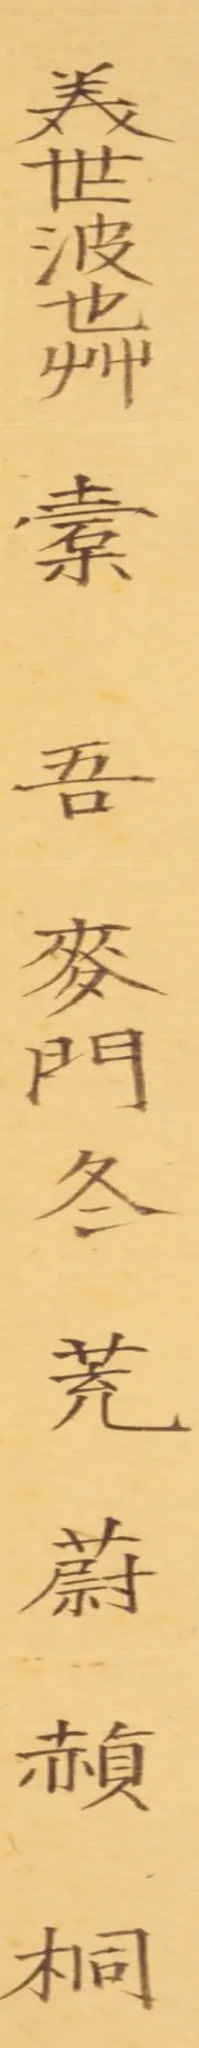美世波也艸橐吾麦門冬茺蔚赬桐
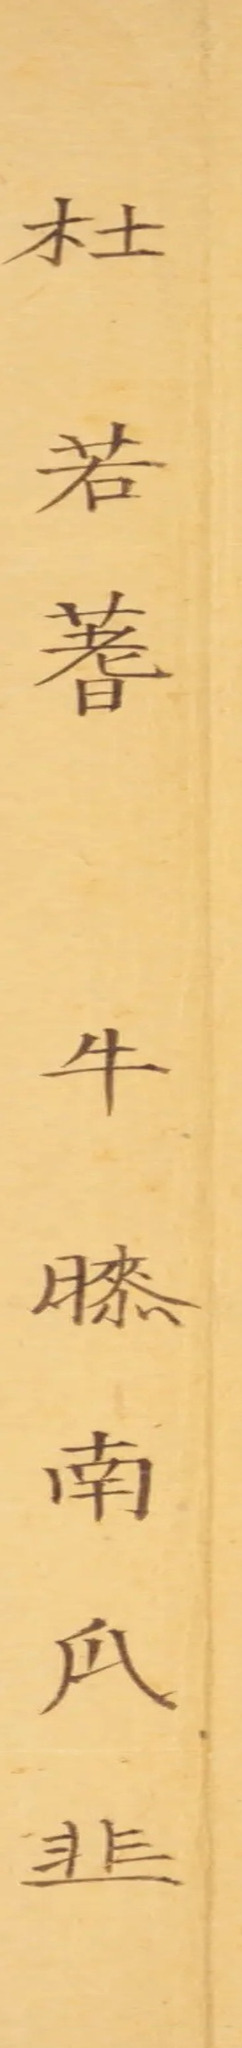杜若蓍牛膝南瓜韭
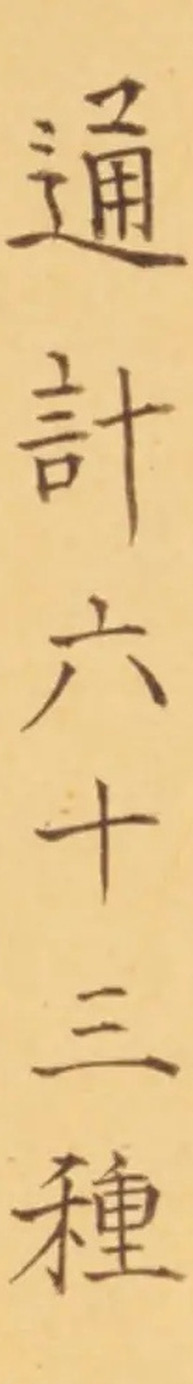通計六十三種
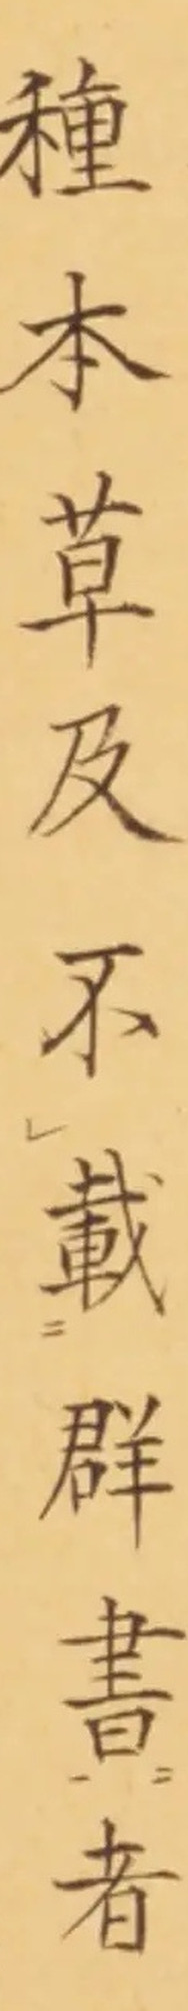種本草及不載群書者
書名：梅園草木花譜秋之部. 1
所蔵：国立国会図書館 National Diet Library, JAPAN
